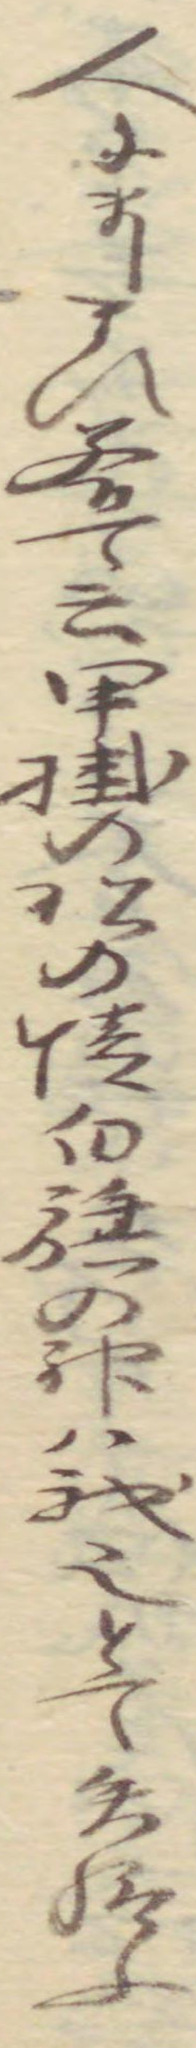人にまします答て云甲掛の松の情白旗の神は我也とて告給ふ
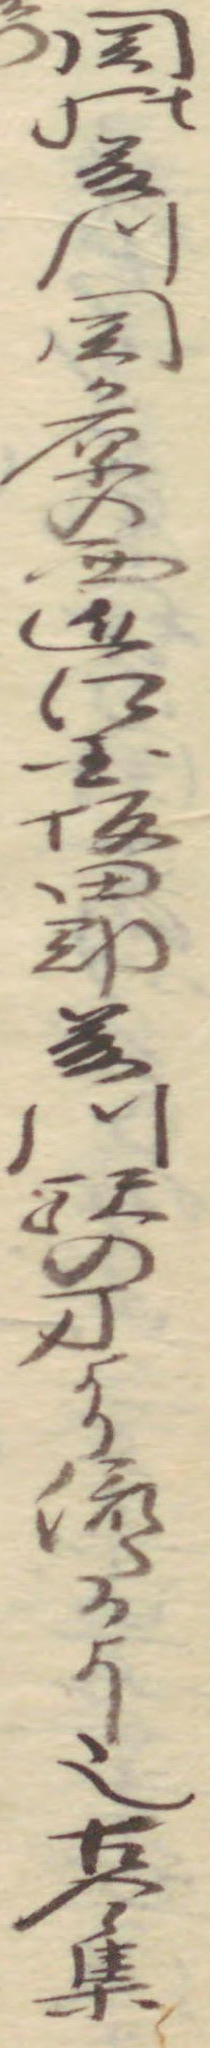関の藤川関ヶ原の西近江国坂田郡藤川駅の方より流たるよし也古今集
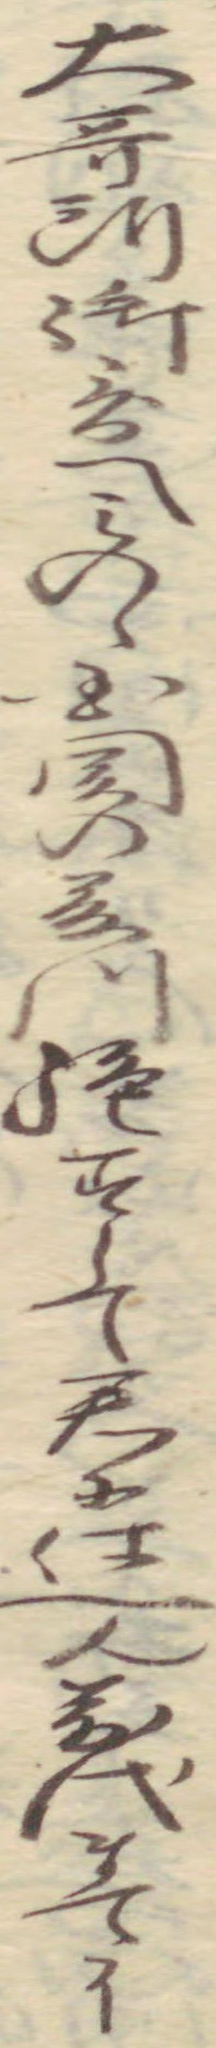大歌所御歌〽みのゝ国関の藤川絶すして君に仕へん万代まてに
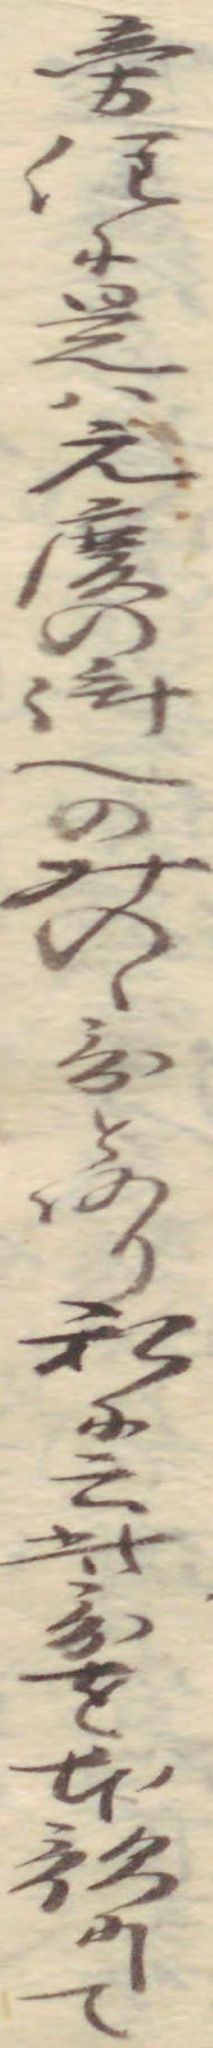旁注に是は元慶の御へのみのゝ歌とあり私に云此歌を本歌にして
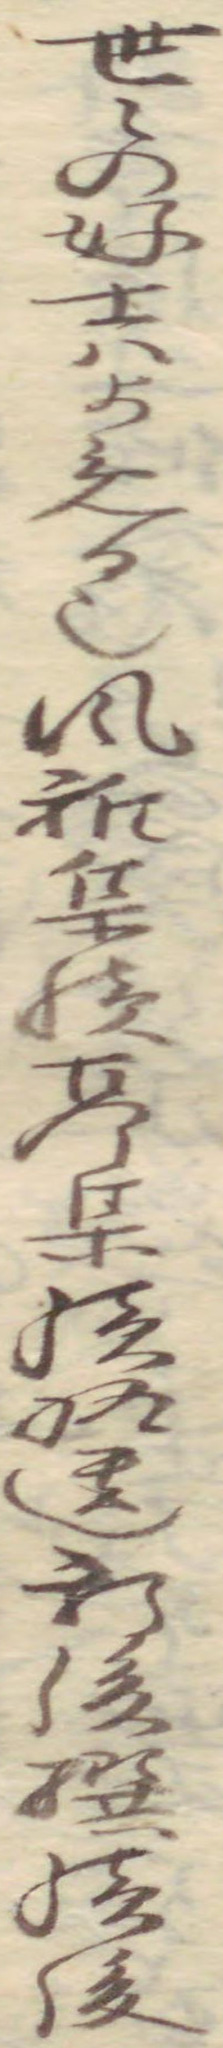世〻の好士はよめる也風雅集続古今集続拾遺集新後撰続後
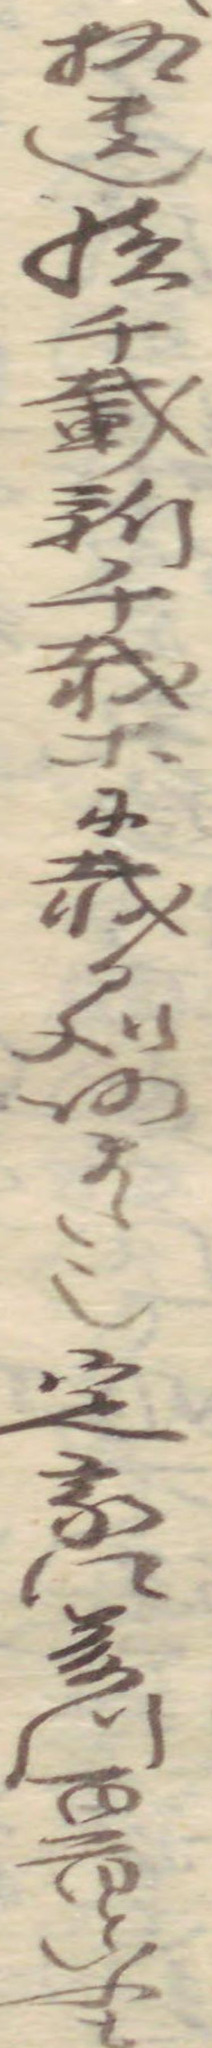拾遺続千載新千載等に載る処あまた也定家卿藤川百首といふも
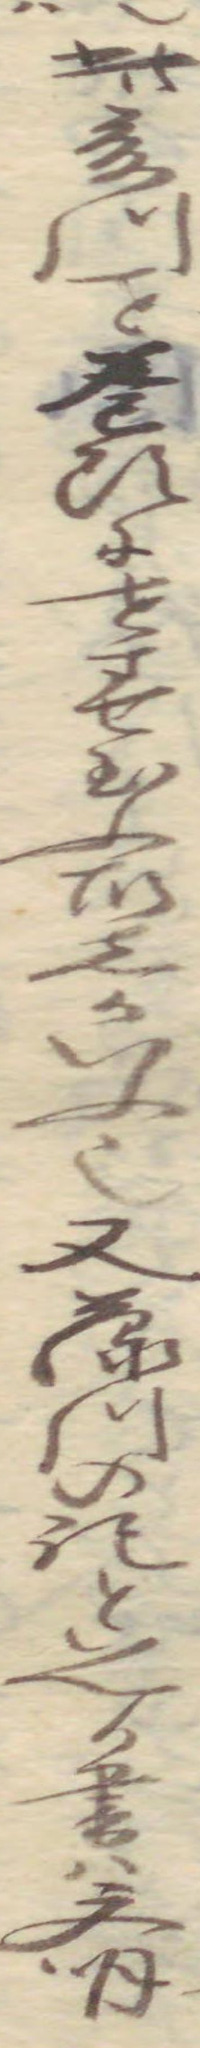此藤川を巻頭にせさせ玉ふ故しかいふ也又藤川の記といへる書は文明
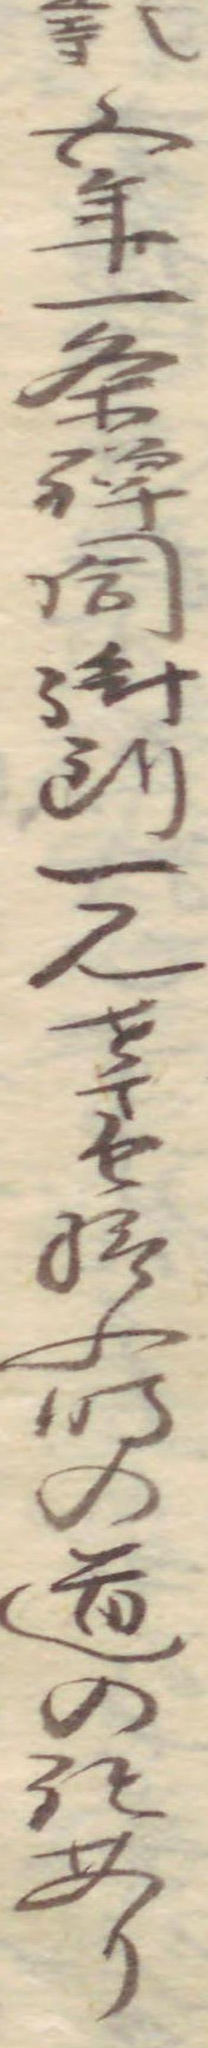五年一条禅閤御所一見せさせ給ふ時の道の記なり
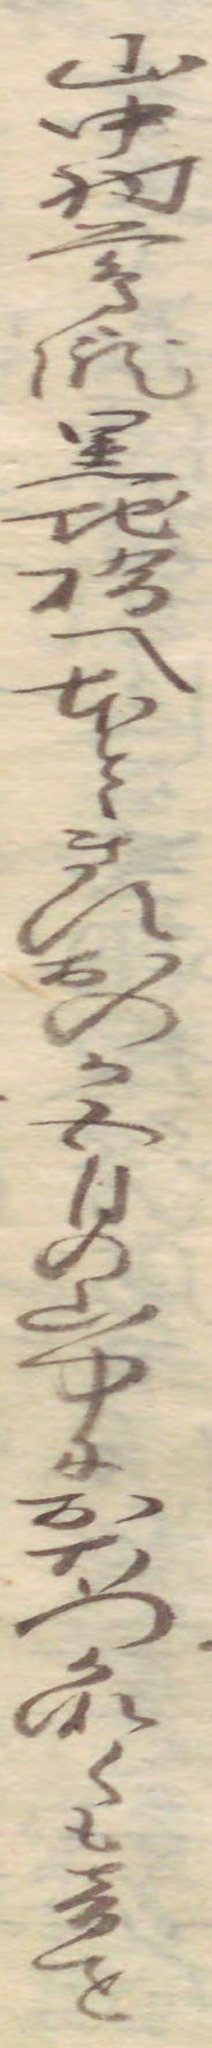山中西鶯滝黒地橋〽ほとゝきすおのか五月の山中におほつかなくも音を
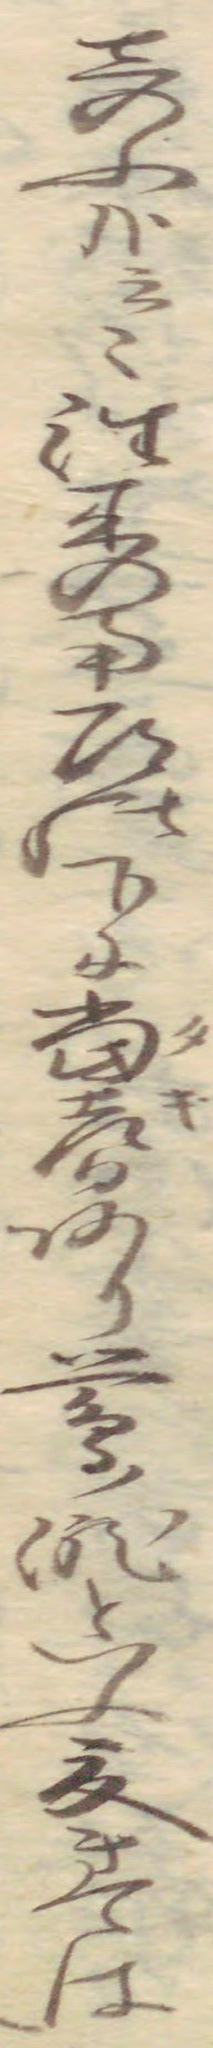しのふ哉云〻往来の南道の下に当耆あり鶯瀧といふ夏きては
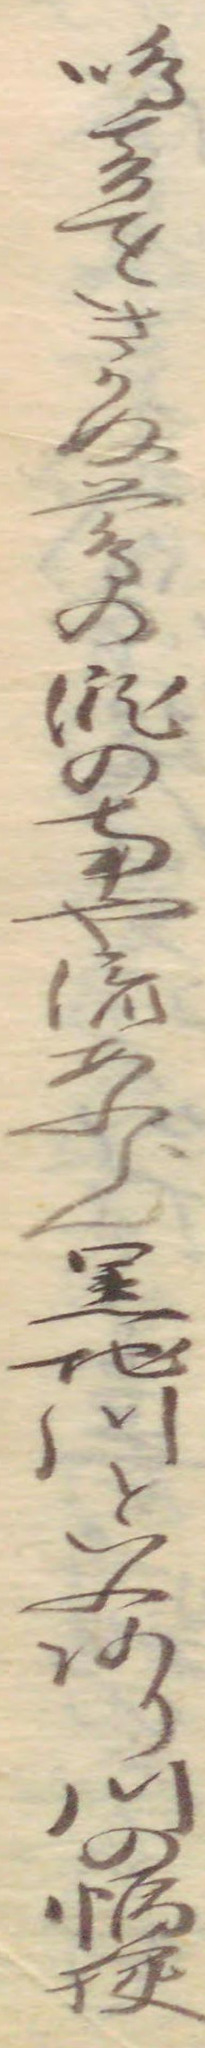鳴音をきかぬ鶯の瀧の南や流あふらん黒地川といふあり川の幅狭

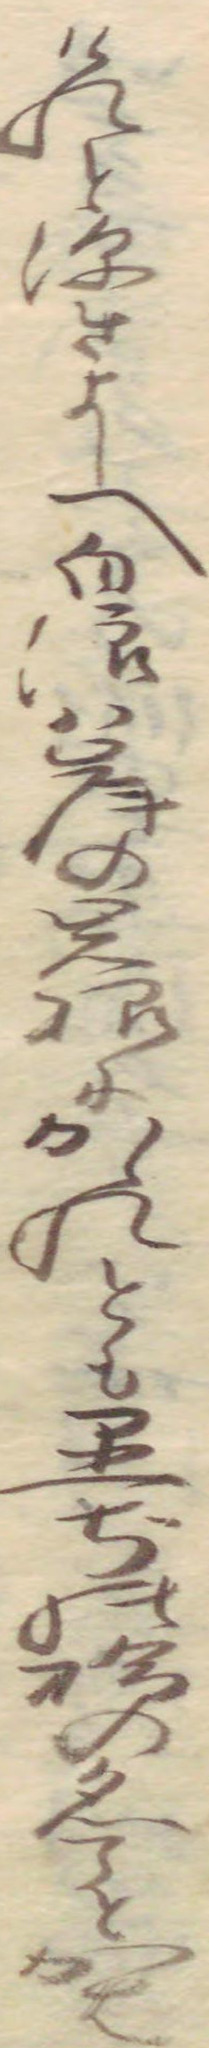けれと深きよし〽白浪は岸の岩根にかゝれとも黒ぢの橋の名こそかは
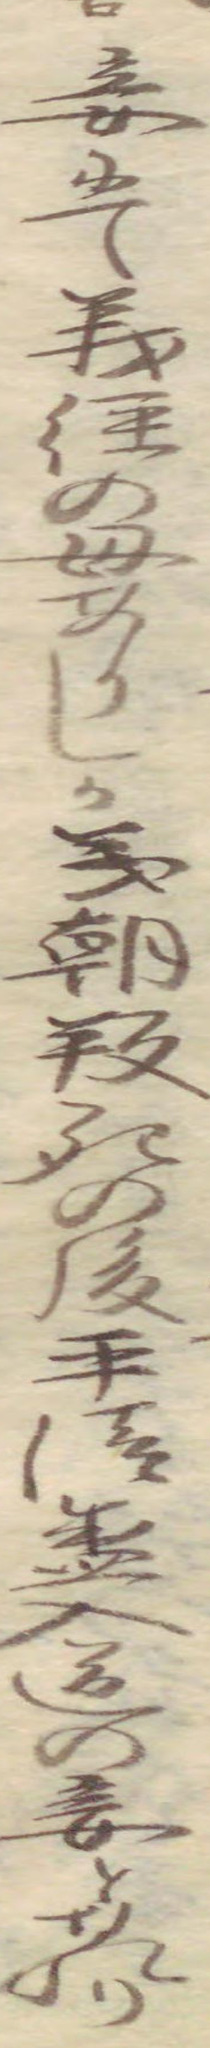妾にて義経の母なりしか義朝叛死の後平清盛入道の妾となれり
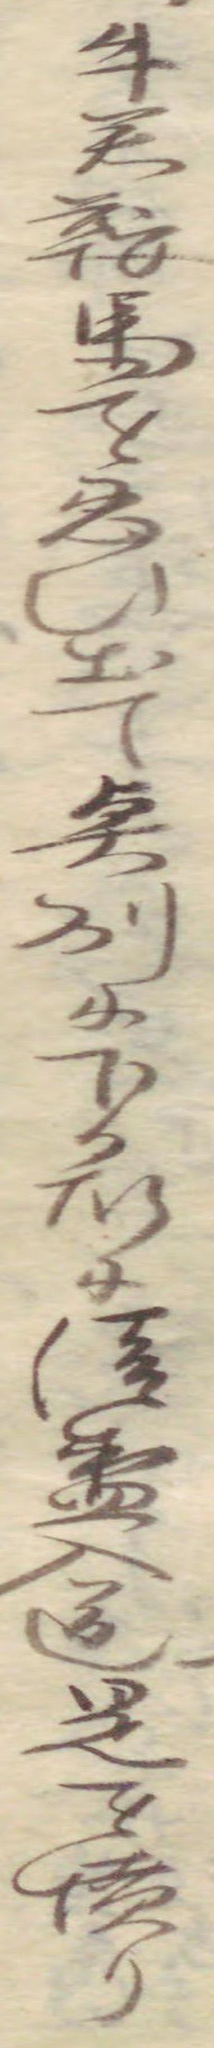牛若鞍馬を忍ひ出て奥州に下る故に清盛入道是を憤り
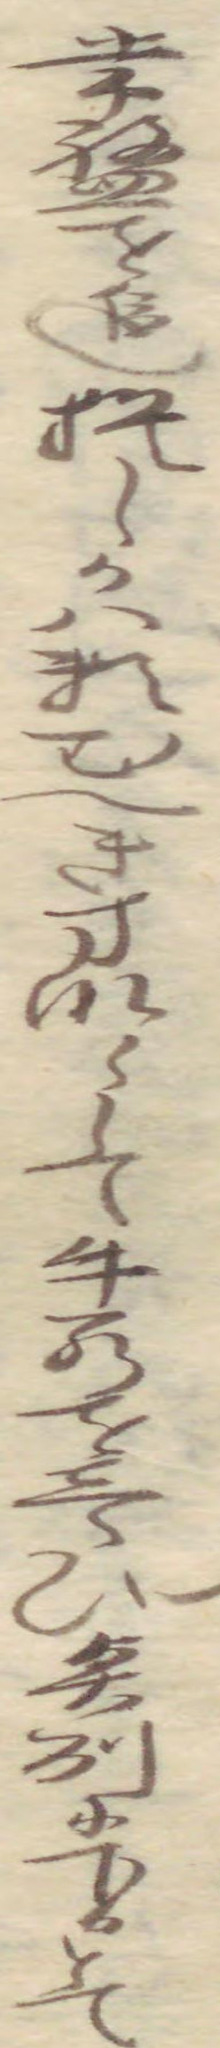常盤を追捉しかは頼むへき方なくして牛若をしたひ奥州に下るとて
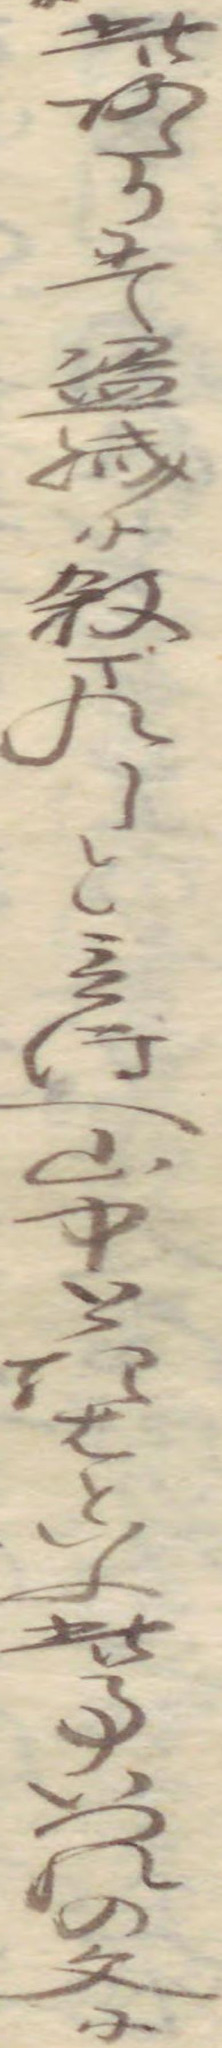此あたりにて盗賊に殺されしと言伝へ山中ときはといふ此事いつれの文に
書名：鶯宿雑記. 巻263-264
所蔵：国立国会図書館 National Diet Library, JAPAN
